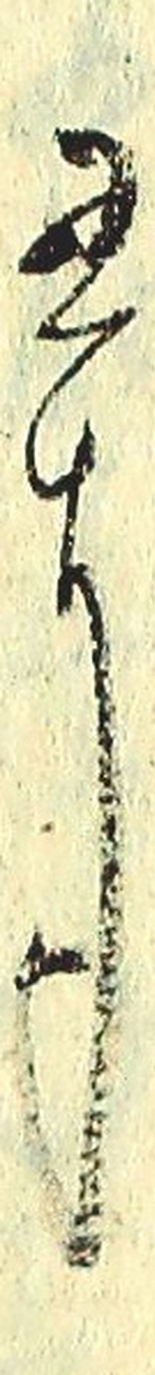丑十月
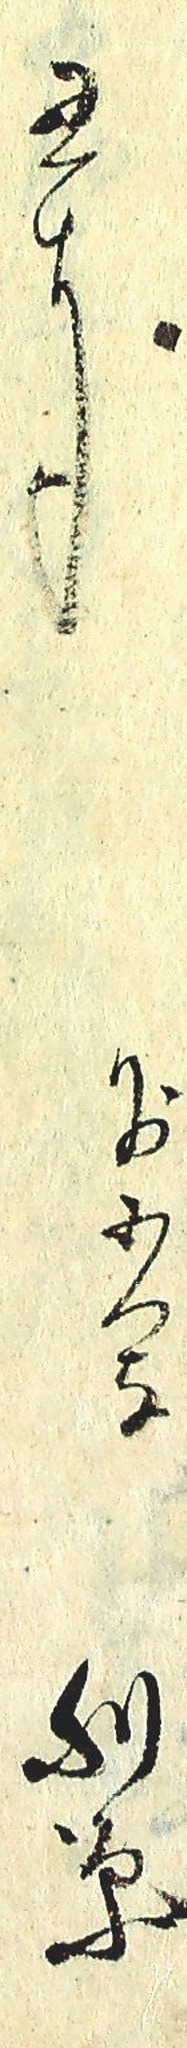丑十月
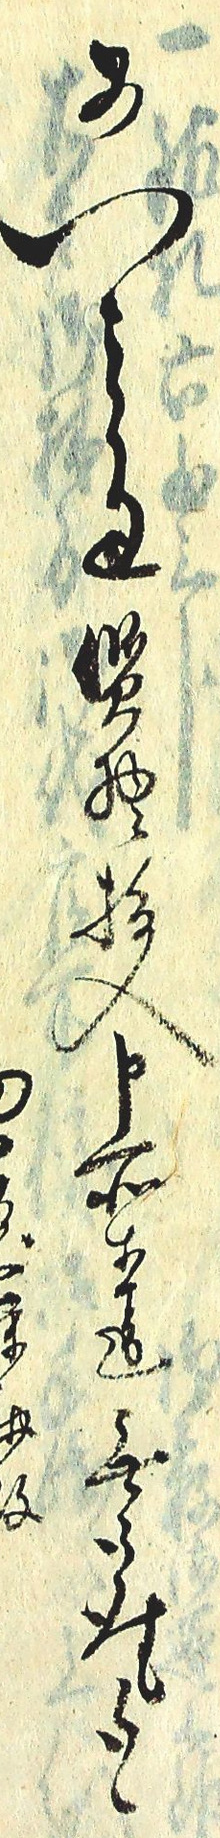右之通質物に指入申所相違無御座候以上
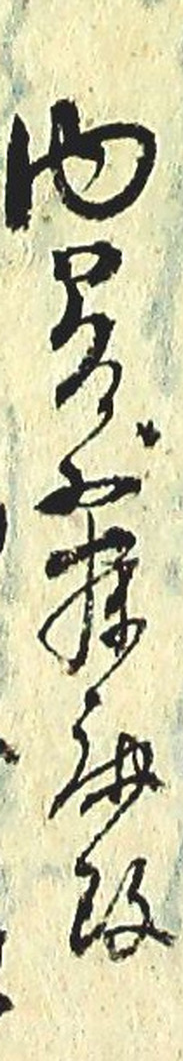内谷村寐床改
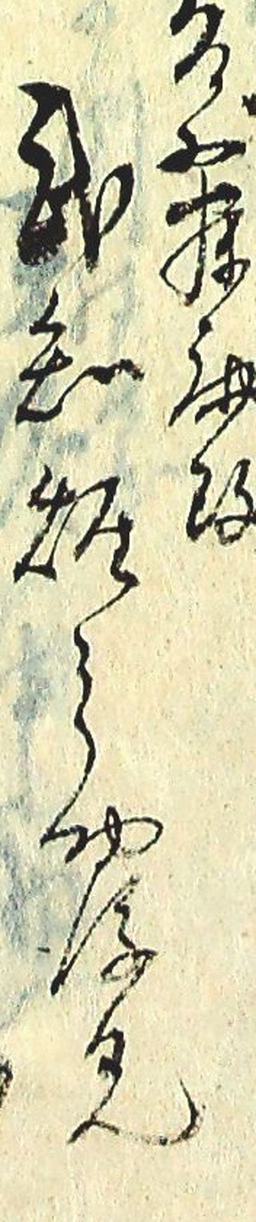武知雄之助後見
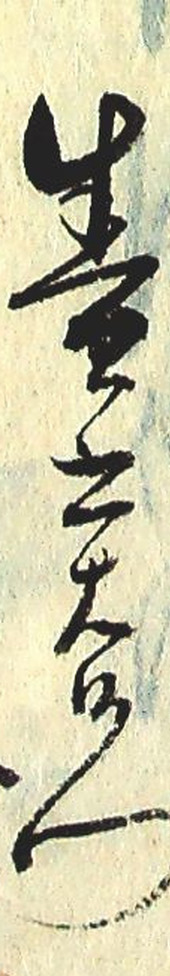盛六右衛門
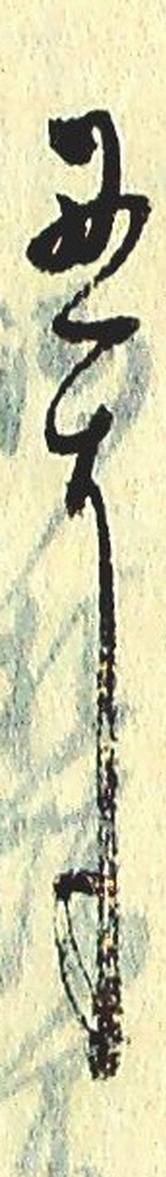丑十月
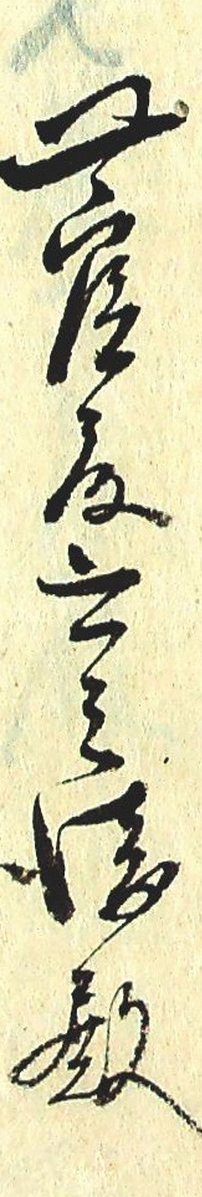菅藤六兵衛殿

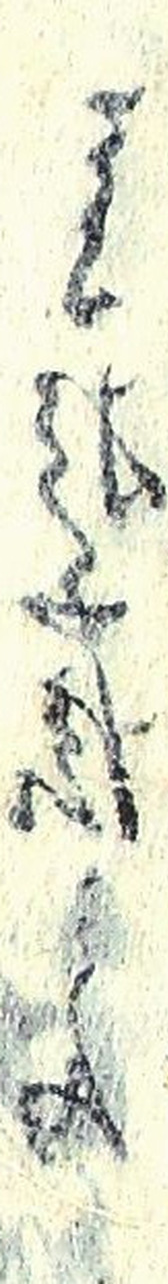十一月廿一日
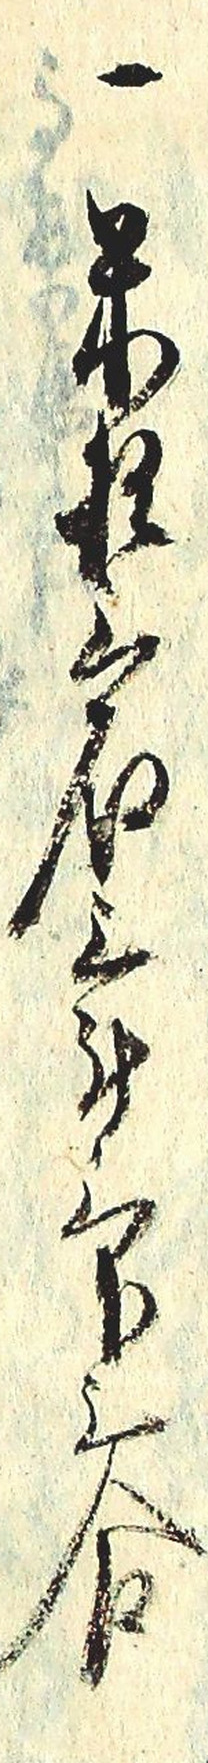一米拾三石三斗三升三合
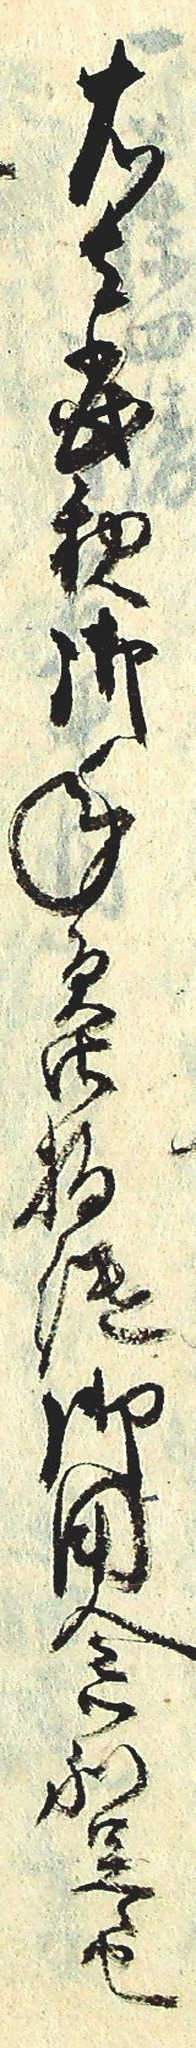右は当秋御年貢御指継御用金利足之内へ
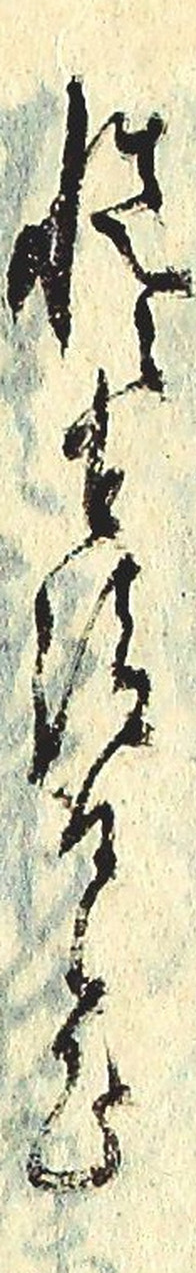慥に奉請取候以上
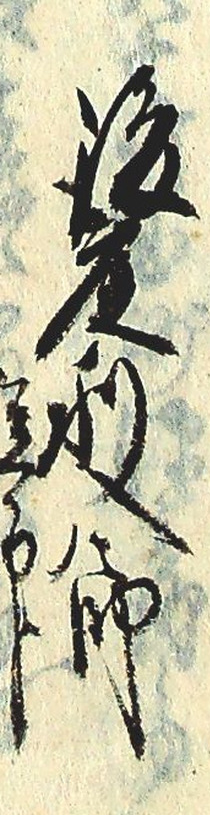後藤利八郎
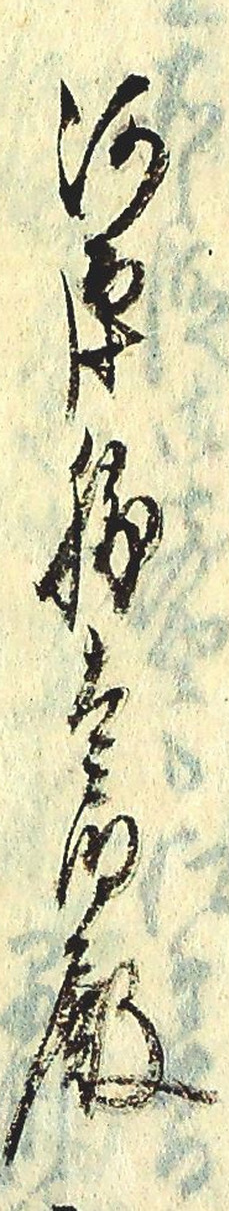河原勝太郎殿
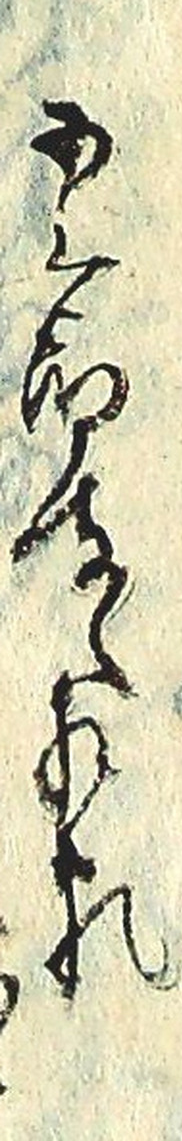五三郎殿へ相頼
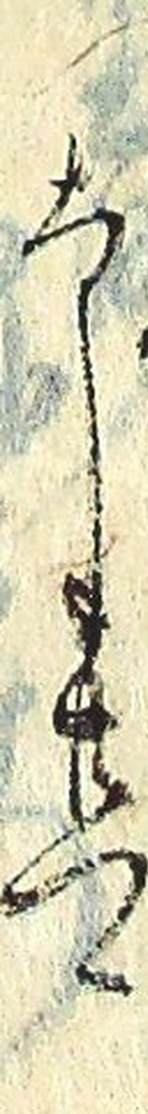十一月廿一日
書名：諸御願書控(弐番）
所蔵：鳴門教育大学 Naruto University of Education
